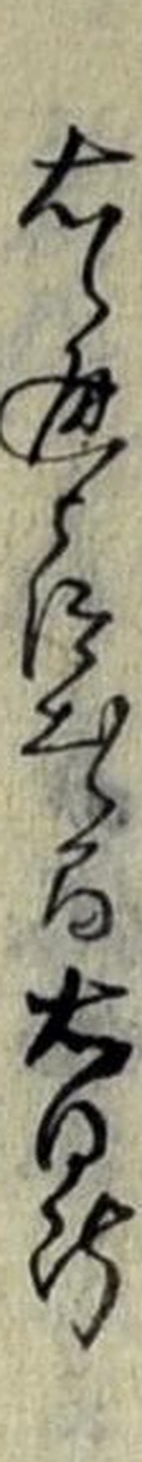右之通被仰出候間右同断
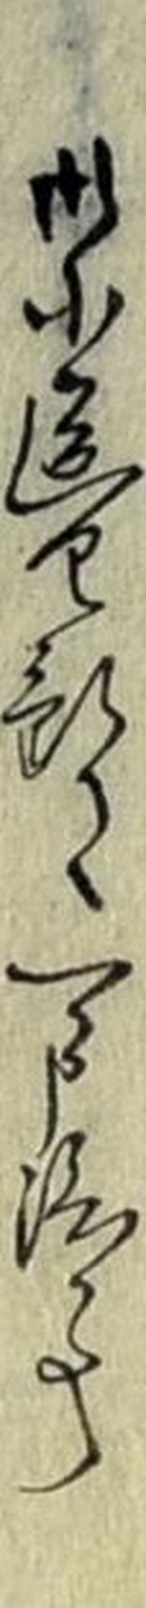御小道具預りへ可申渡事
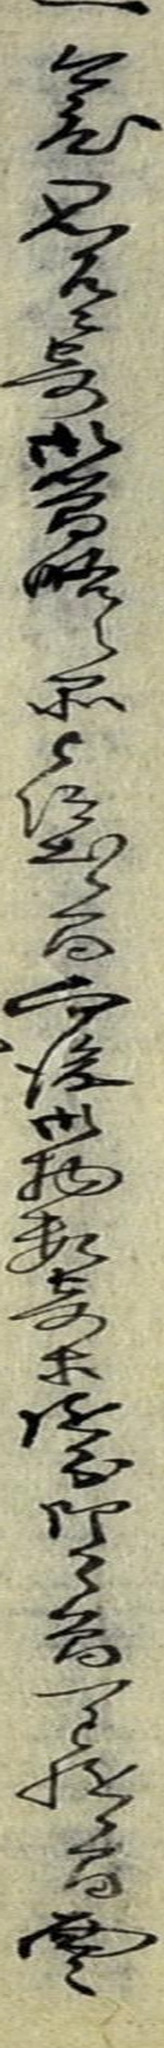一今度思召ニ寄御簡略之品被仰出候間向後御物数奇等随分御了簡可被遊候間面々
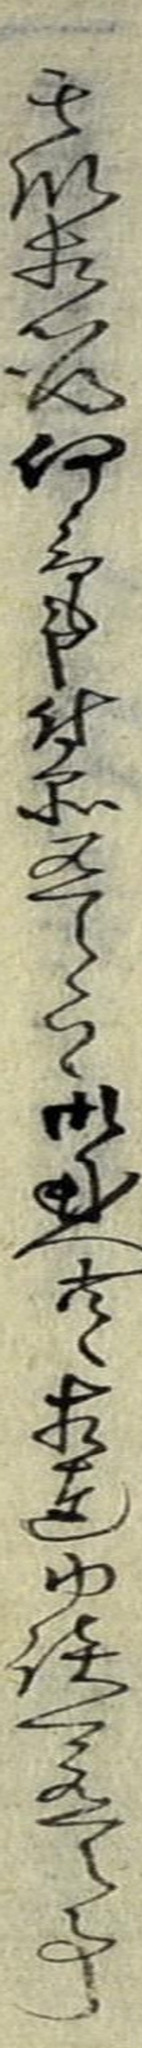其段相心得何ニ而も申付品有之候ハヽ御用人共へ相達申談可有之事
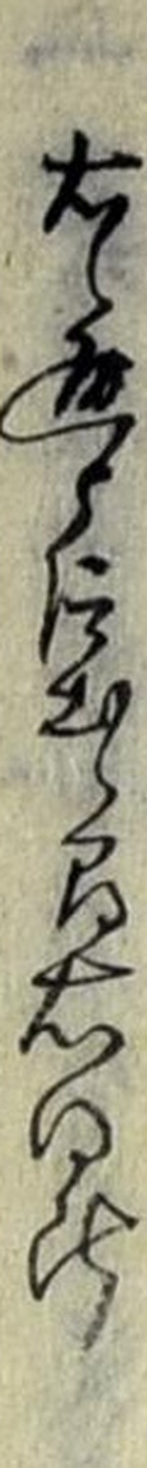右之通被仰出候間右同断
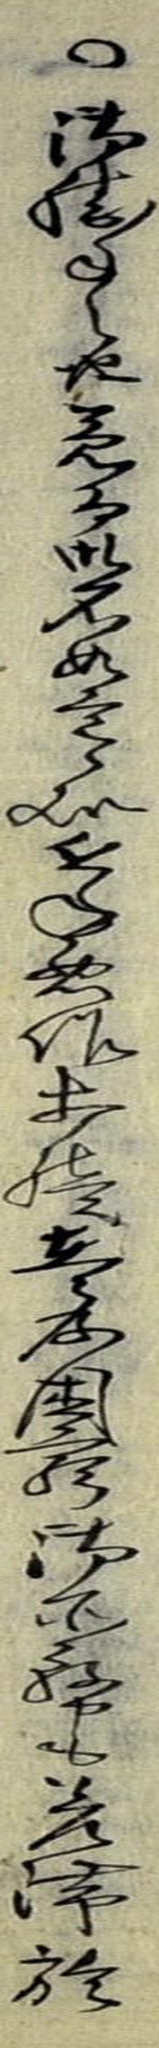〇御勝手之儀兼而御不如意候処近年悪作打続在々及困窮御所務も差滞於
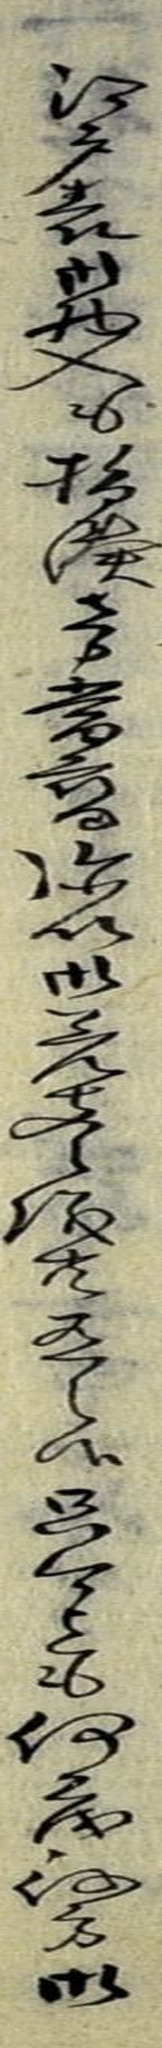江戸表御物入も指湊旁当暮弥以御差支之儀共有之候只今迄も何茂役方御
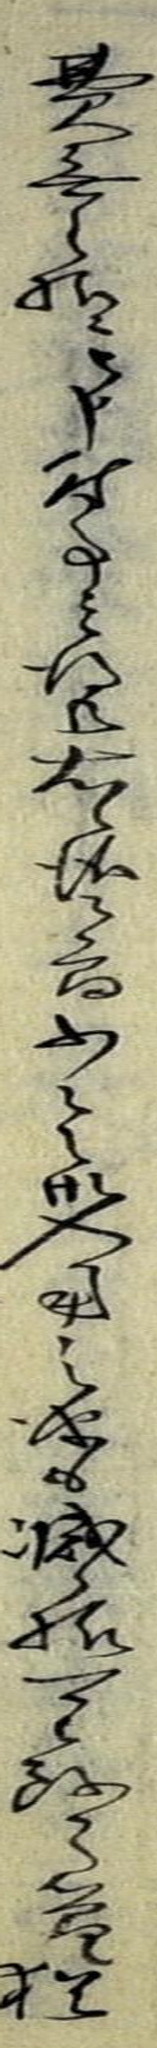費無之様ニ被申付事ニ候得共右之趣ニ候間少々之御入用之儀も減候様可被致了簡候猶
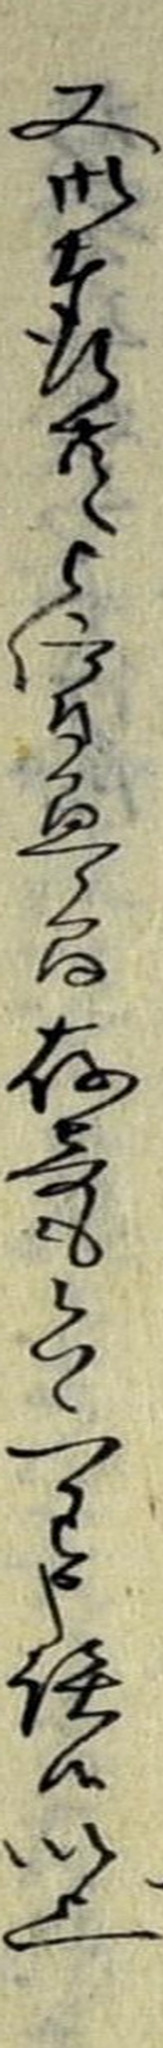又御奉行共へ被仰付置候間存寄も候ハヽ可被申談候以上
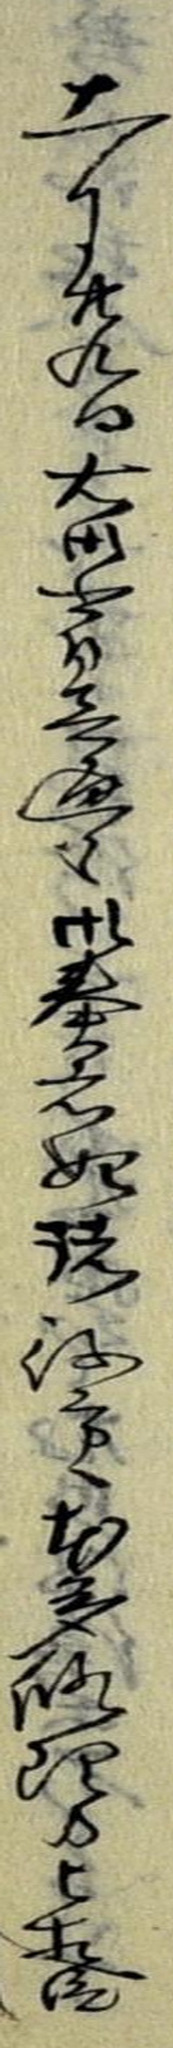十一月廿九日右御書付壱通ツヽ御奏者始諸役方へ本多修理方被相渡之
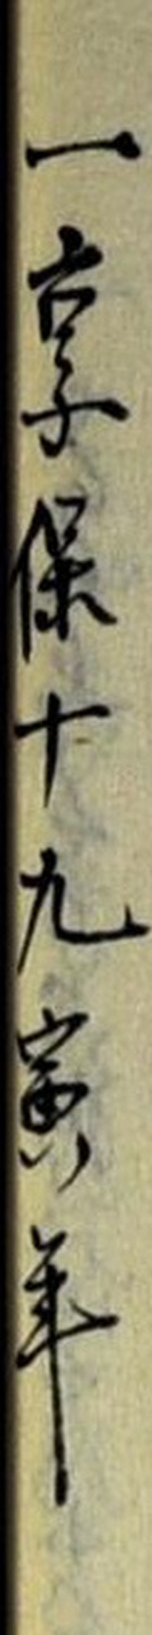一享保十九寅年
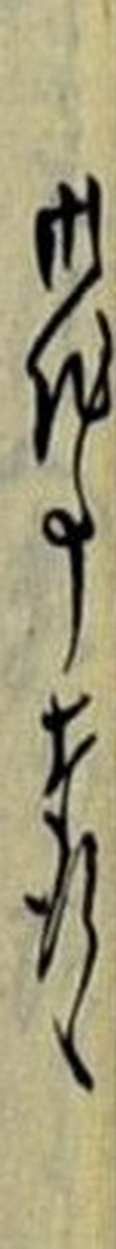御作事奉行へ
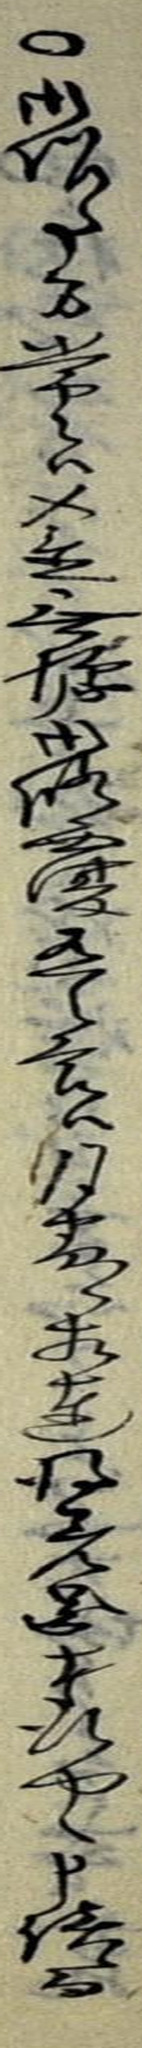〇御作事方常々ハ〆置無拠御修覆有之候節ハ月番へ相達得差図奉行中へ申談候而
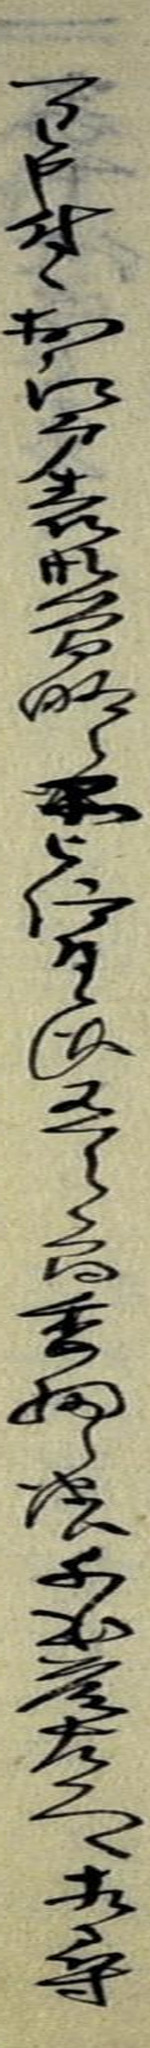可被申付候於江戸表御簡略之品被仰付候趣有之候間委細之儀ハ千本藤左衛門へ相尋
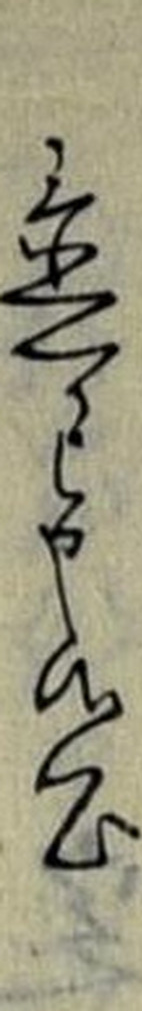置可被申候以上
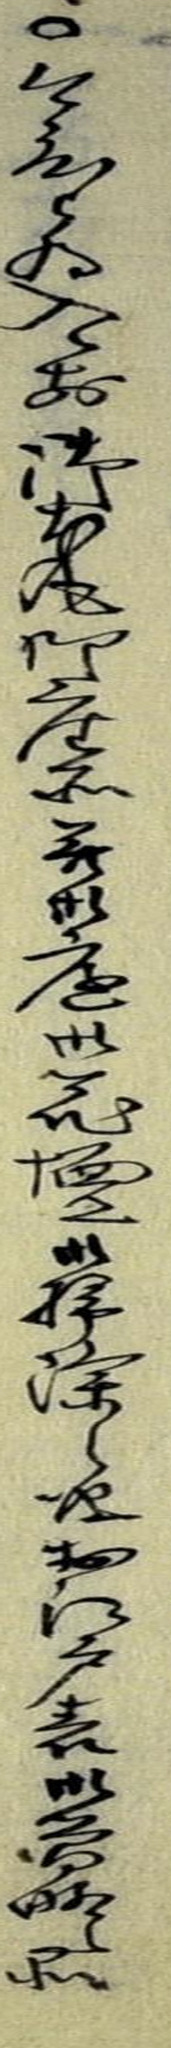〇今度被為入候前御本丸御座所并御庭御花壇御掃除之儀於江戸表御簡略之品
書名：命令之部 一
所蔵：福井県文書館 Fukui Prefectural Archives
